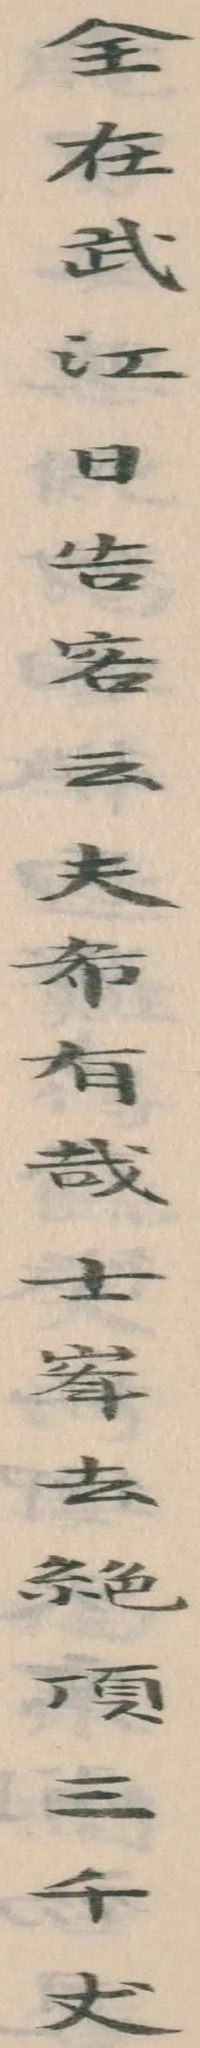全在武江日告客云夫希有哉士峯去絶頂三千丈
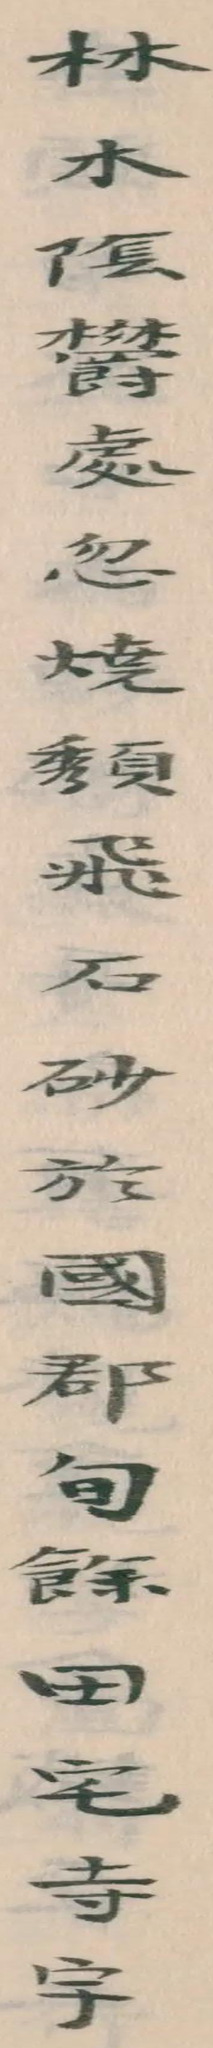林木陰欝處忽焼頺飛石砂於國郡旬餘田宅寺宇
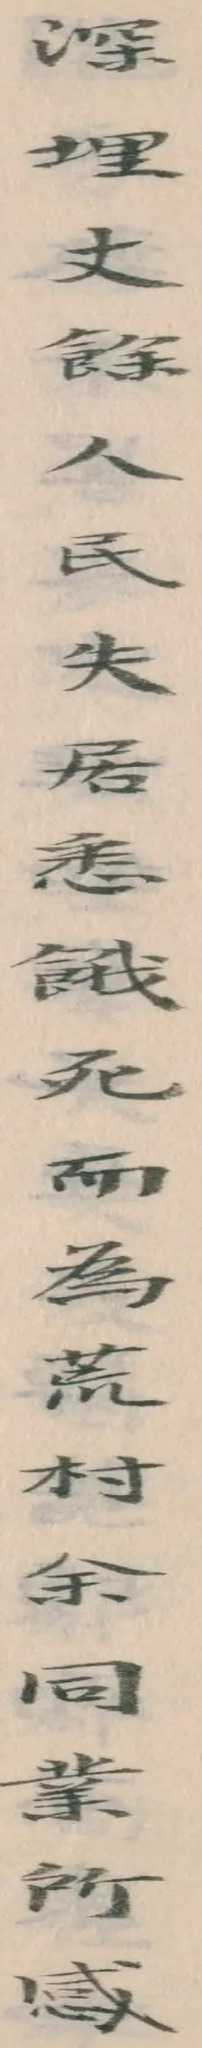深埋丈餘人民失居悉餓死而為荒村余同業所感
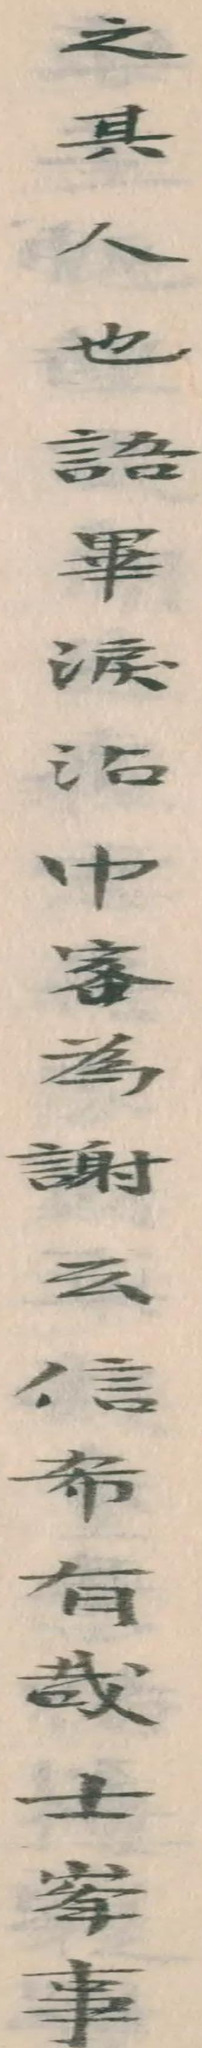之其人也語畢涙沾巾客為謝云信希有哉士峯事
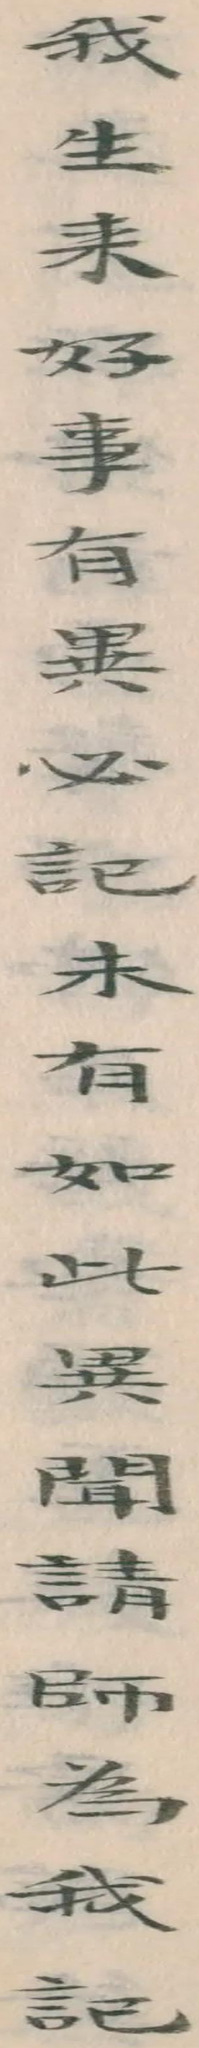我生来好事有異必記未有如此異聞請師為我記
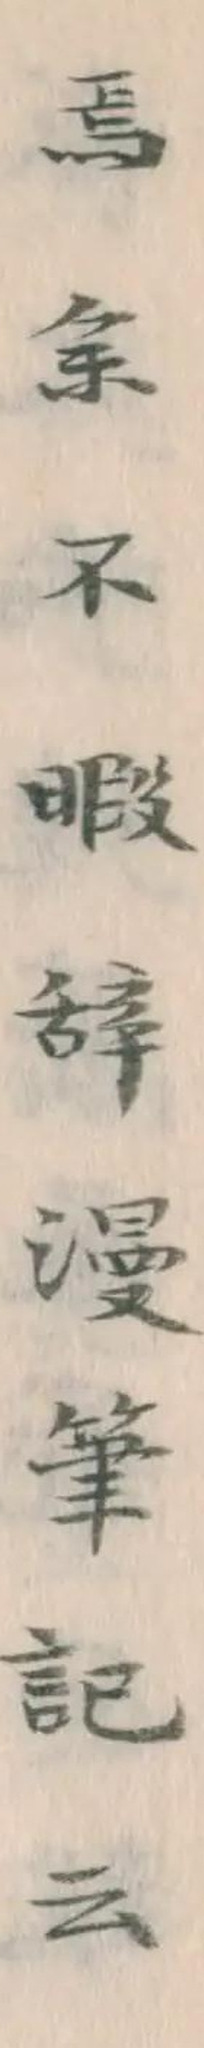焉余不暇辞漫筆記云
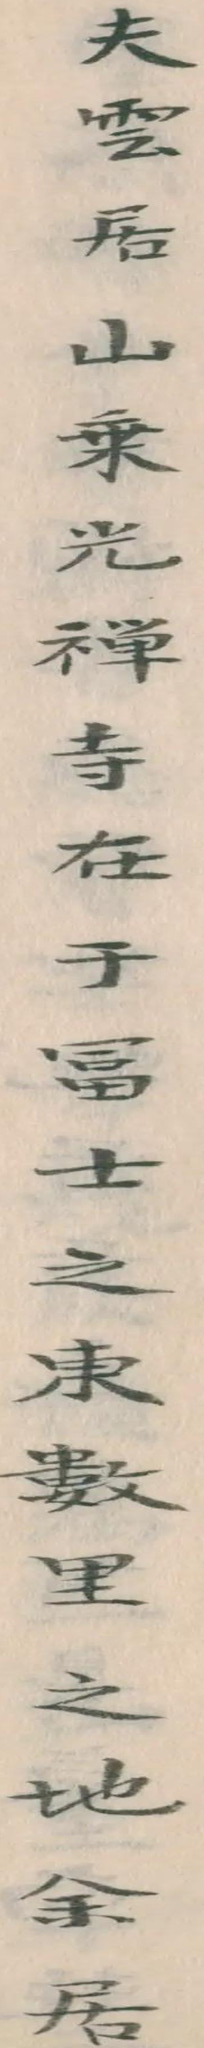夫雲居山乗光禅寺在于冨士之東數里之地余居
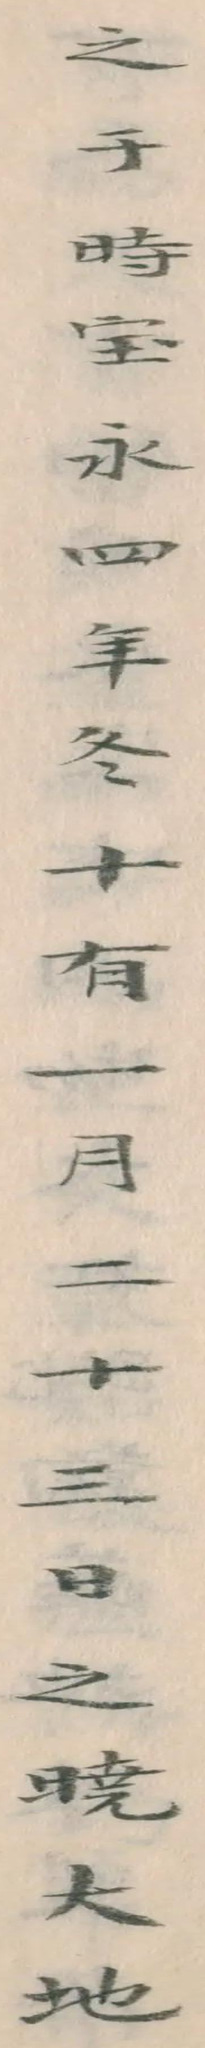之于時宝永四年冬十有一月二十三日之暁大地
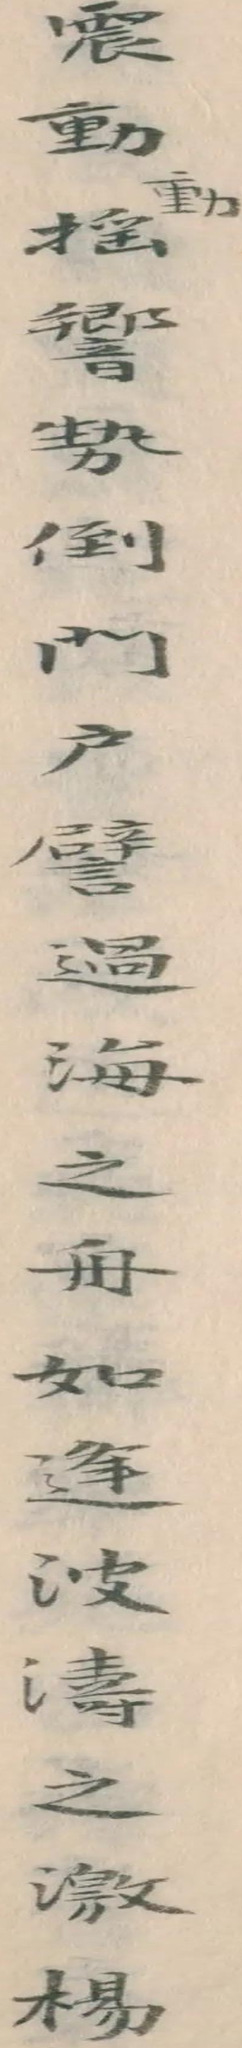震動動揺響㔟倒門戸譬過海之舟如逢波濤之激楊

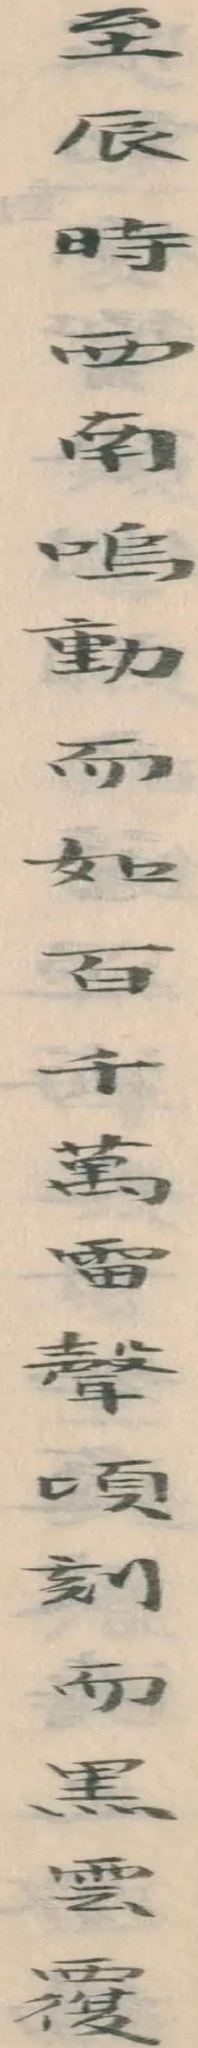至辰時西南鳴動而如百千萬雷聲頃刻而黒雲覆
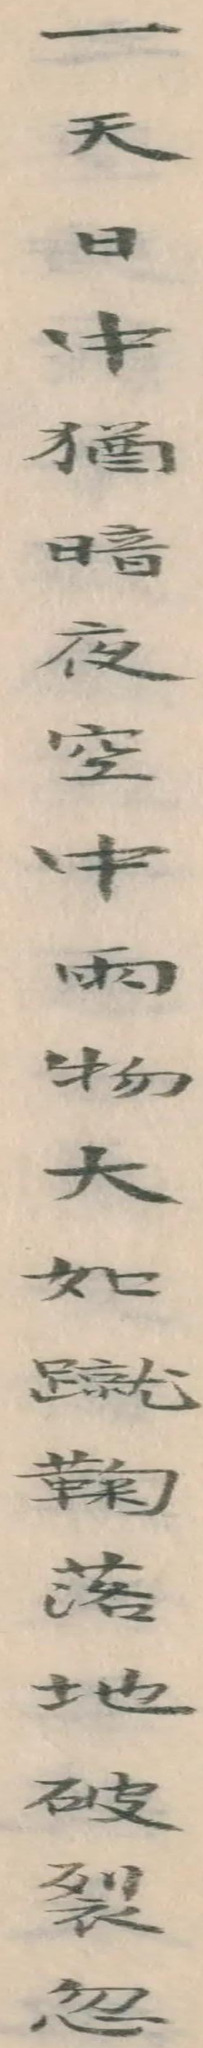一天日中猶暗夜空中雨物大如蹴鞠落地破裂忽
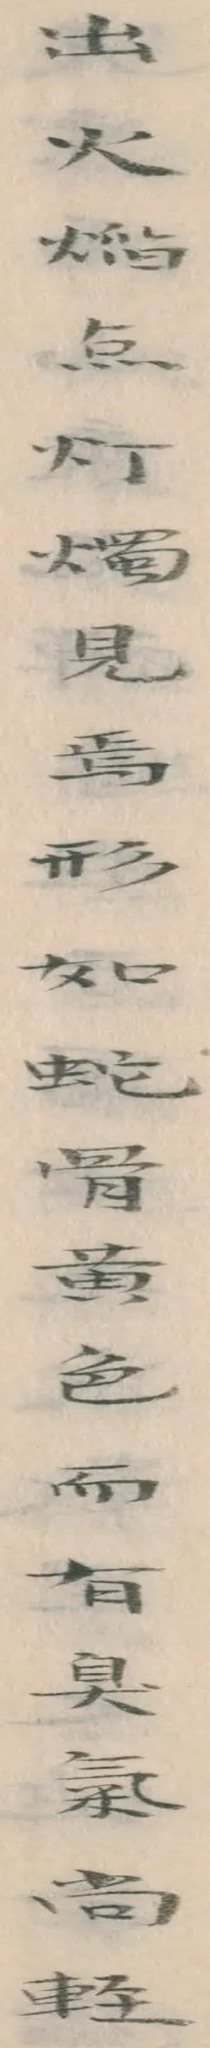出火㷔点灯燭見焉形如蛇骨黄色而有臭氣尚軽
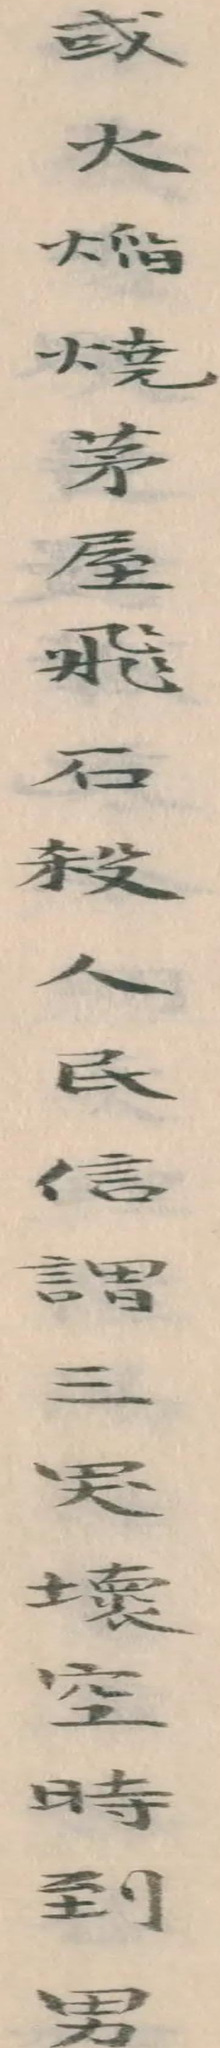或火㷔焼茅屋飛石殺人民信謂三哭壊空時到男
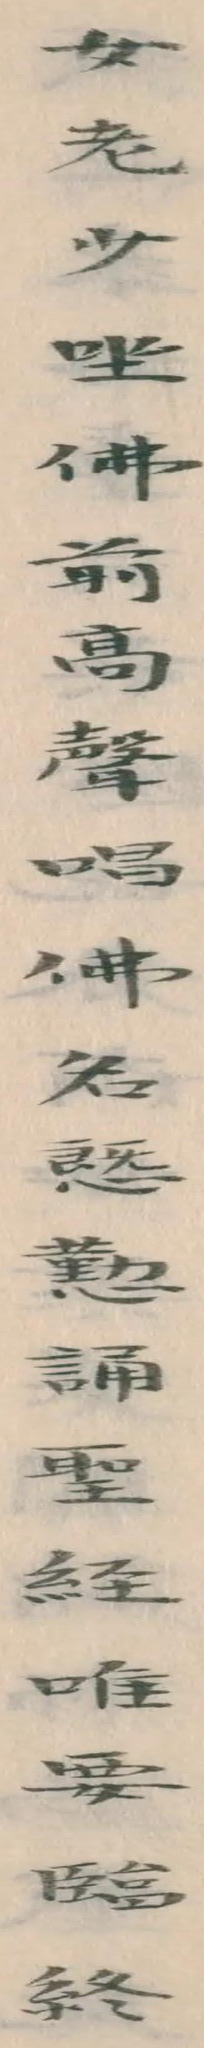女老少㘴佛前髙聲唱佛名慇懃誦聖経唯要臨終
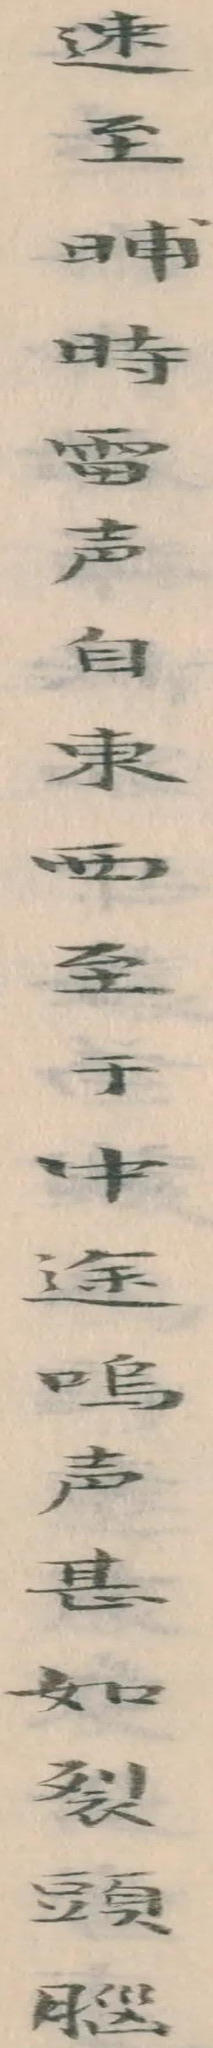速至晡時雷声自東西至于中途鳴声甚如裂頭脳
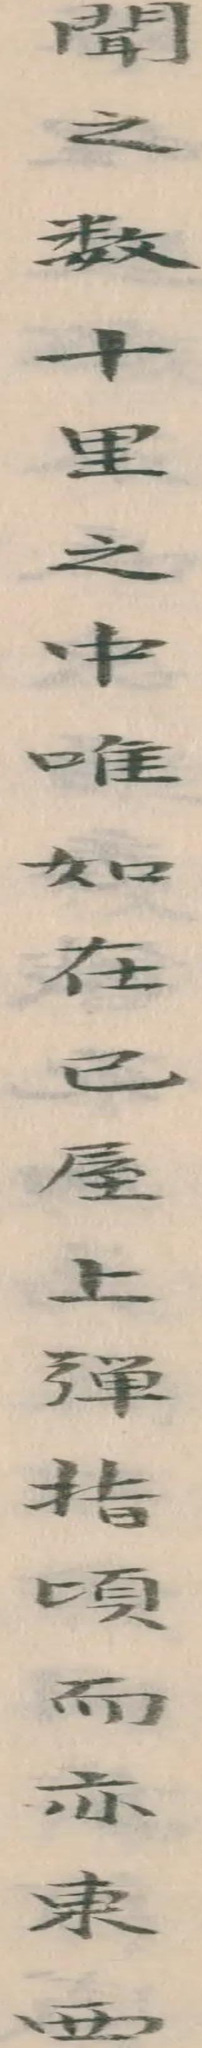聞之数十里之中唯如在已屋上弾指頃而亦東西
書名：地災撮要. 巻11-12(地震之部)
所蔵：国立国会図書館 National Diet Library, JAPAN
